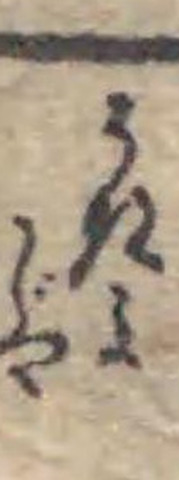うきよ
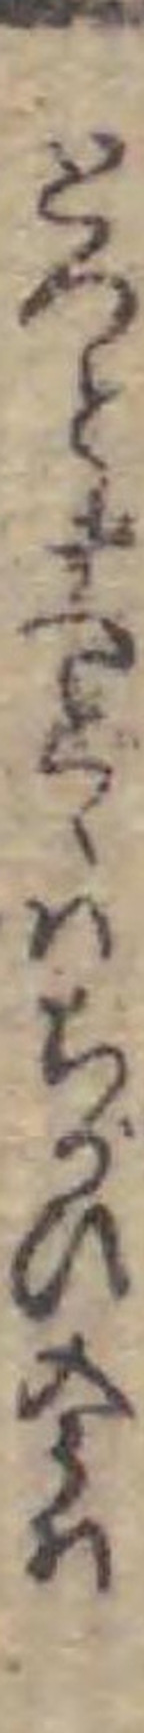とつとまへどく？はちがひ今は
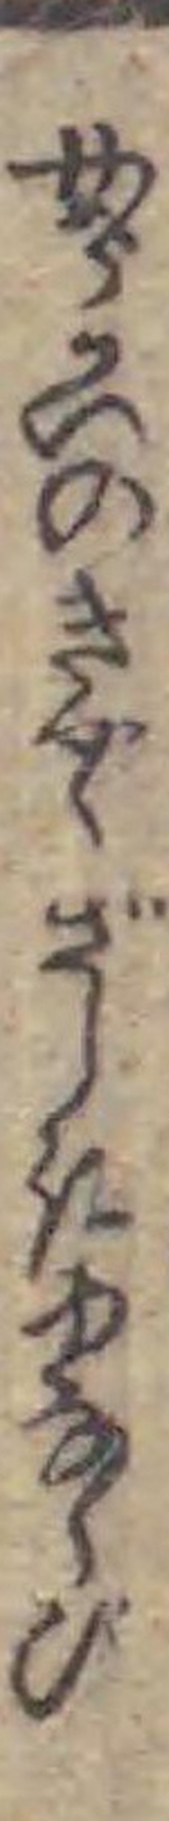女郎かいのきやくざしきにならび
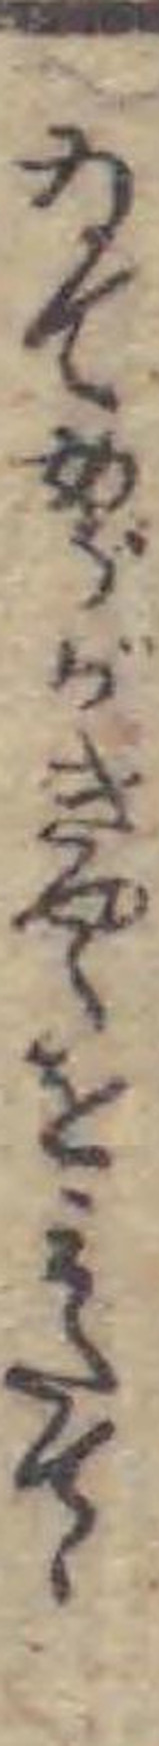ゐて女郎がきやくをみたてゝ
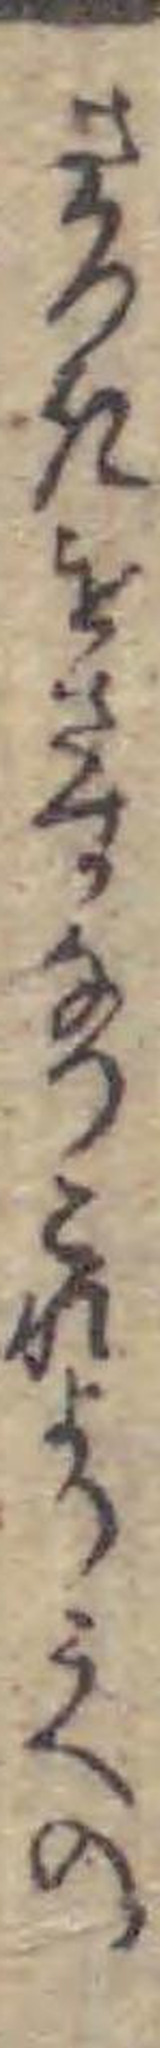さかつきをさすなりこれよりうへの
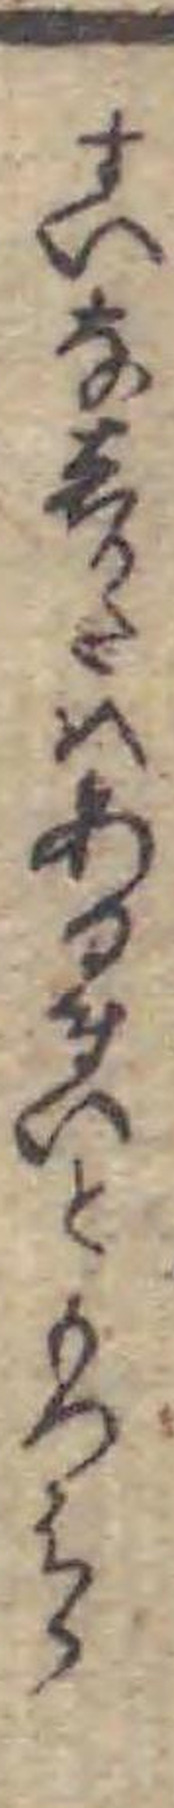すいなしかたはあるまいともつはら
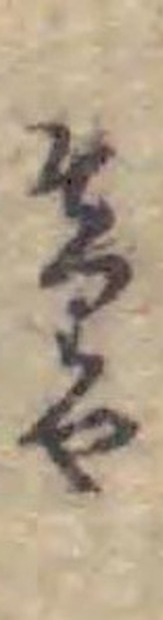そりや
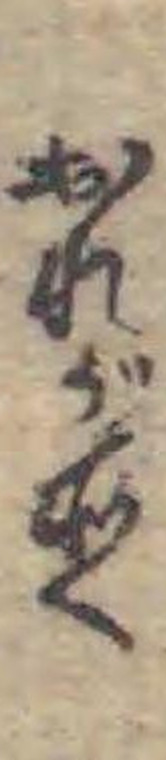おれが所へ
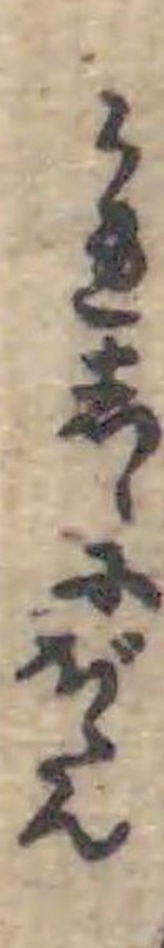うれしゝにぼたん
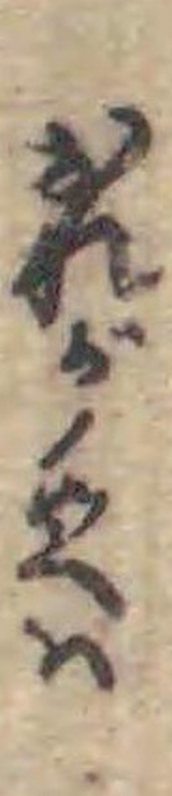おれが所へは
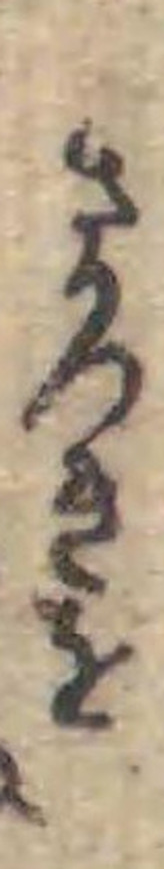さかつきを
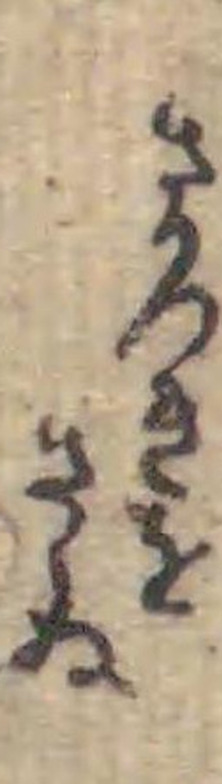さゝぬ
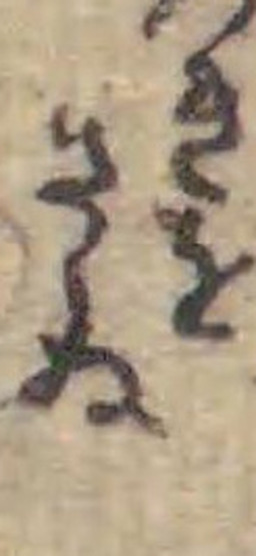さゝぬ
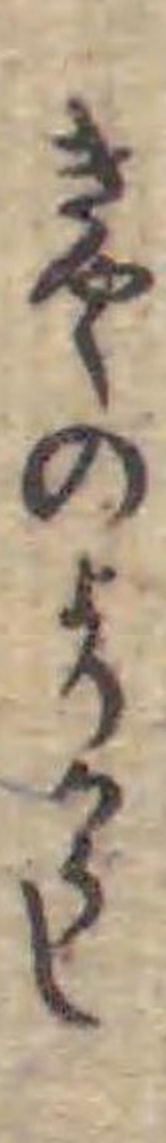きやくのよりからし
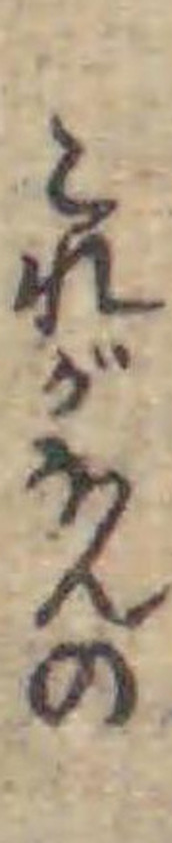これがほんの
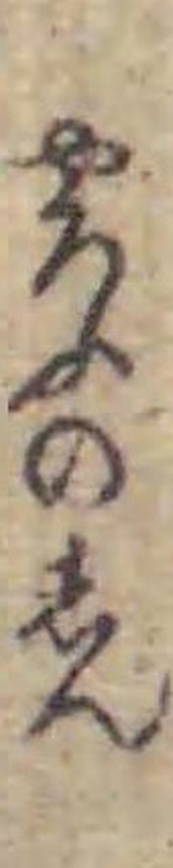やろふのしん
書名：威気千代牟物語 : 2巻
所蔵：国立国会図書館 National Diet Library, JAPAN
